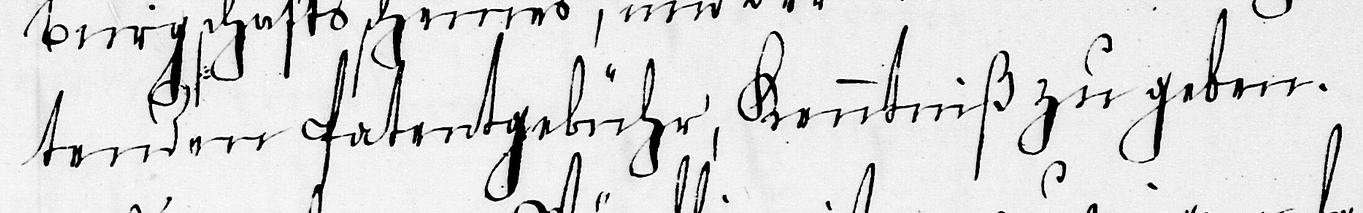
tenden Patentgebühr, Kenntniß zu geben.
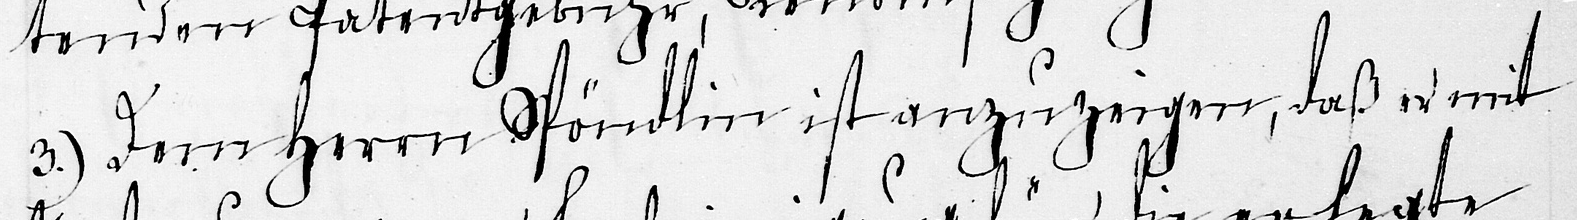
3.) Dem Herrn Spöndlin ist anzuzeigen, daß er mit
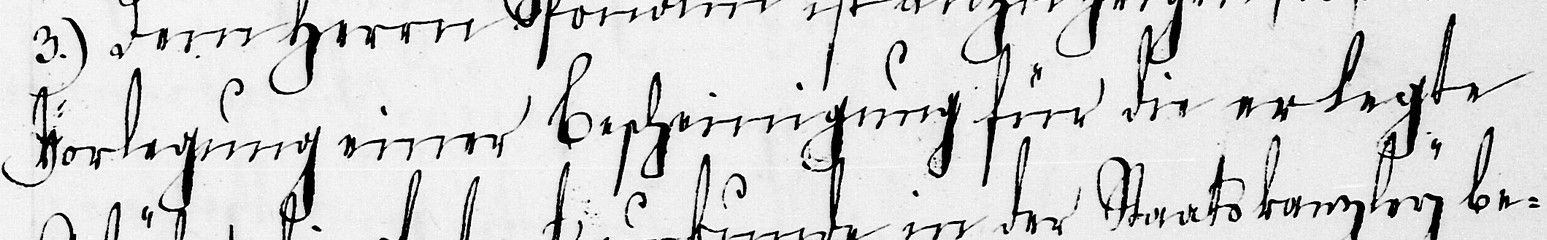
Vorlegung einer Bescheinigung für die erlegte
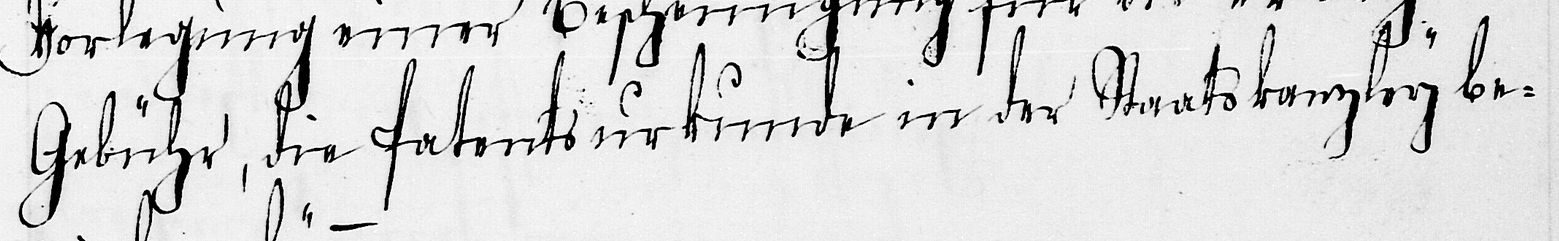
Gebühr, die Patentsurkunde in der Staatskanzley be¬
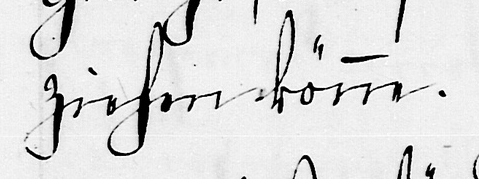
ziehen könne.
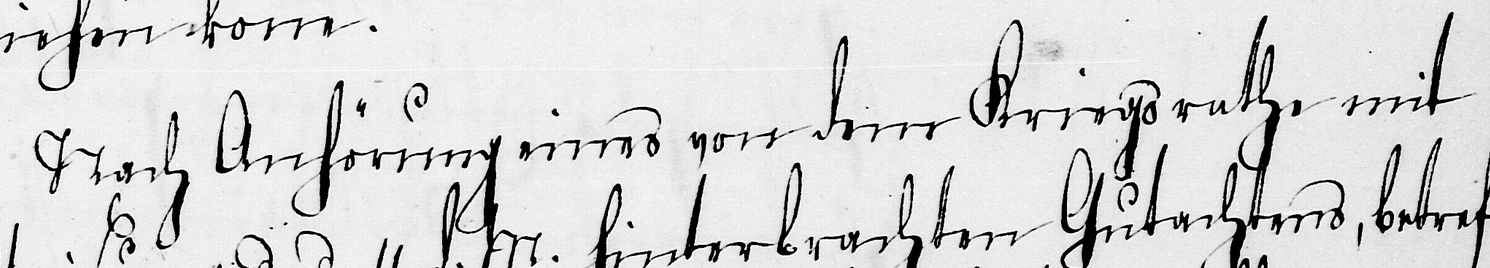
Nach Anhörung eines von dem Kriegsrathe mit
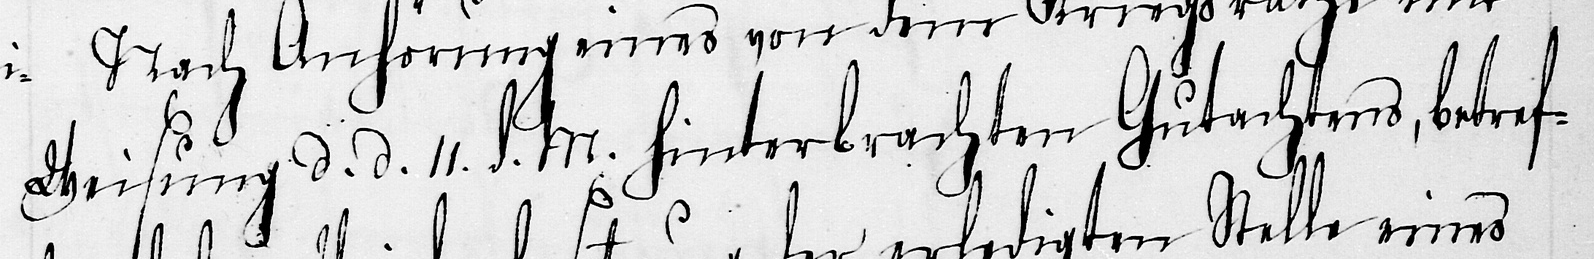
Weisung d. d. 11. d. M. hinterbrachten Gutachtens, betref¬
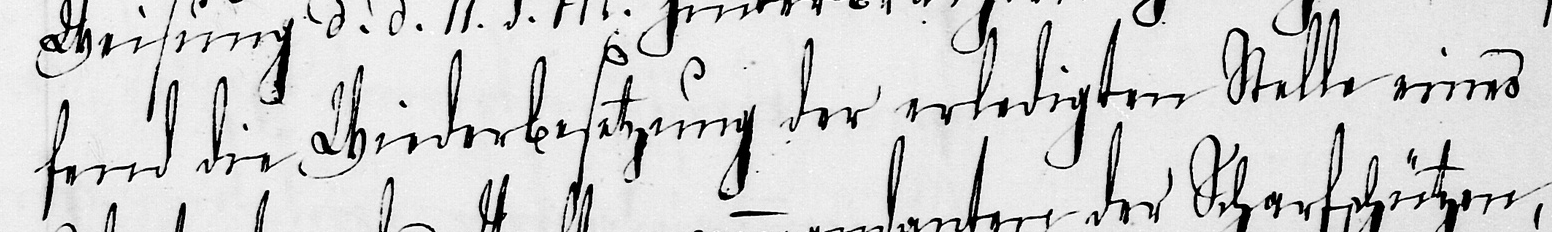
fend die Wiederbesetzung der erledigten Stelle eines
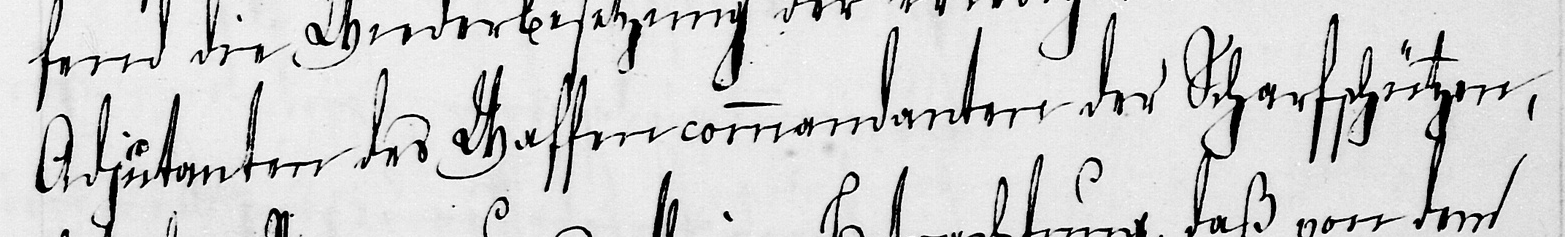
Adjutanten des Waffencommandanten der Scharfschützen,
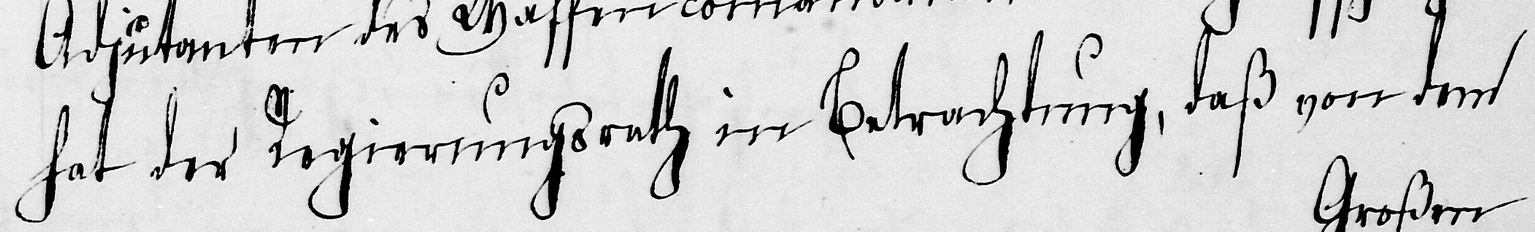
hat der Regierungsrath in Betrachtung, daß von dem
